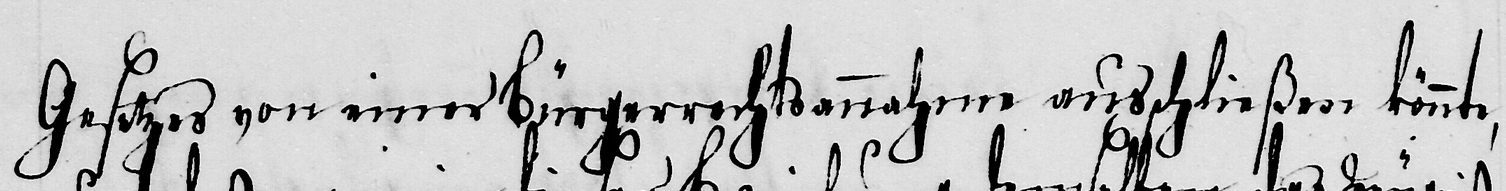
Gesetzes von einer Bürgerrechtsannahme ausschließen könn¬
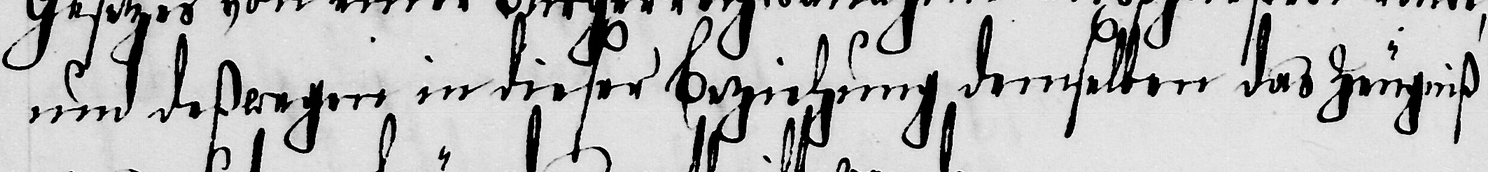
und deßwegen in dieser Beziehung demselben das Zeugniß
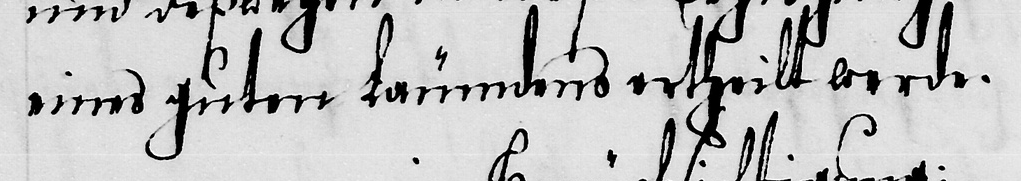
eines guten Läumdens ertheilt werde.
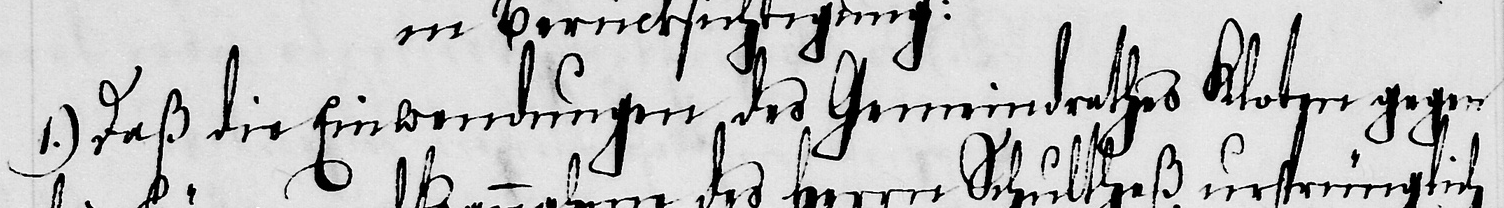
1.) Daß die Einwendungen des Gemeindrathes Kloten gegen
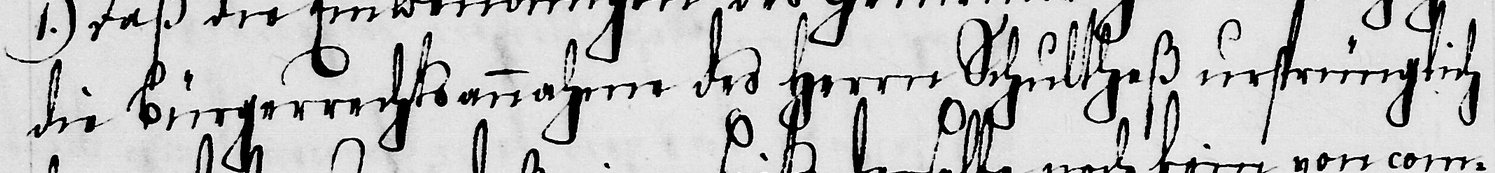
die Bürgerrechtsannahme des Herrn Schultheß ursprünglich
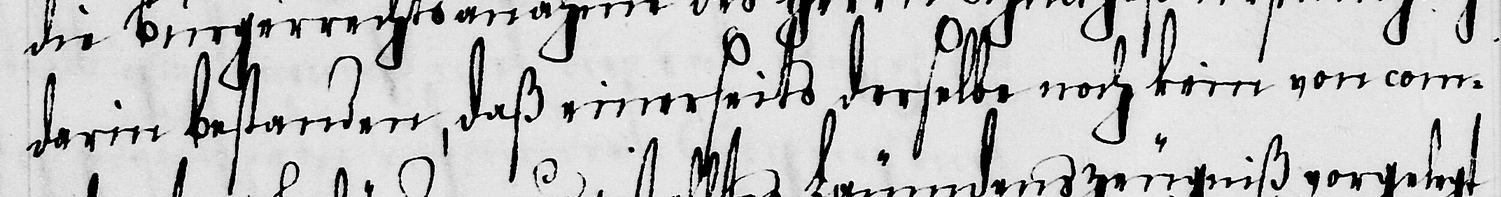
darin bestanden, daß einerseits derselbe noch kein von com¬
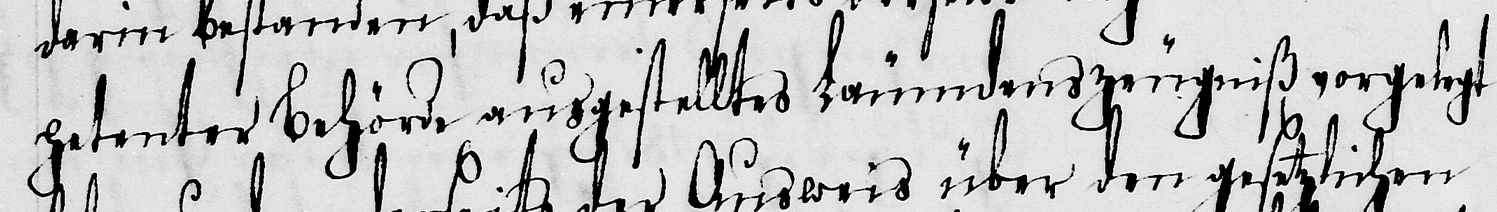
petenter Behörde ausgestelltes Läumdenszeugniß vorgelegt
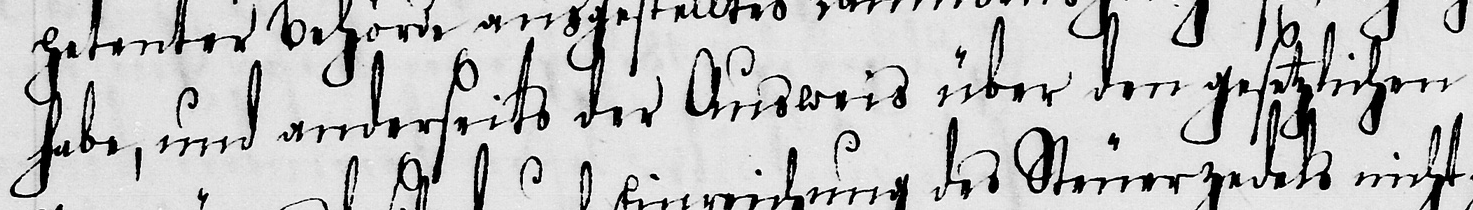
habe, und anderseits der Ausweis über den gesetzlichen
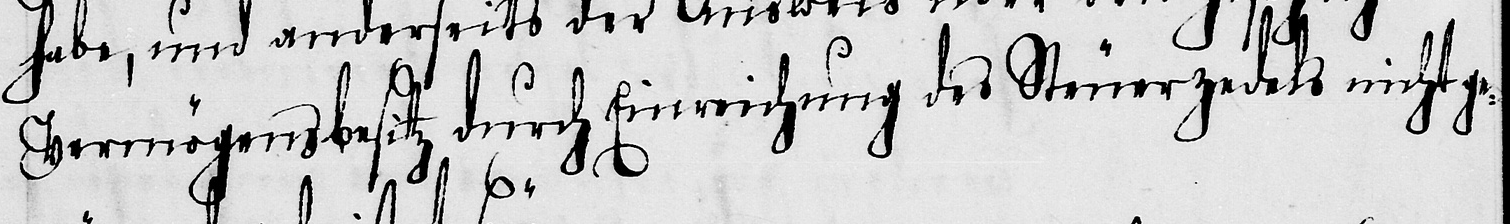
Vermögensbesitz durch Einreichung des Steuerzedels nicht g¬
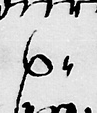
rr¬
